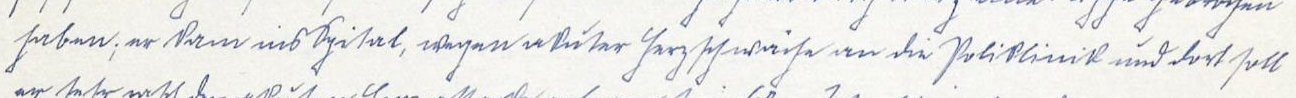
haben, er kam ins Spital, wegen akuter Herzschwäche an die Poliklinik und dort soll
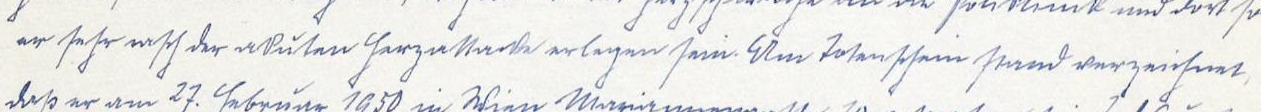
er sehr rasch der akuten Herzattacke erlegen sein. Am Totenschein stand verzeichnet
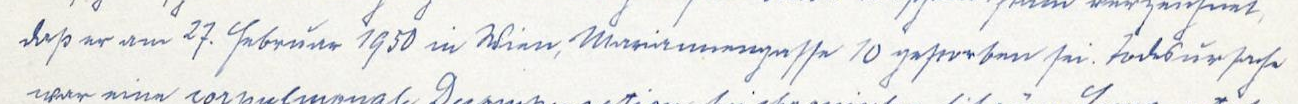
daß er am 27. Februar 1950 in Wien, Mariannengase 10 gestorben sei. Todesursache
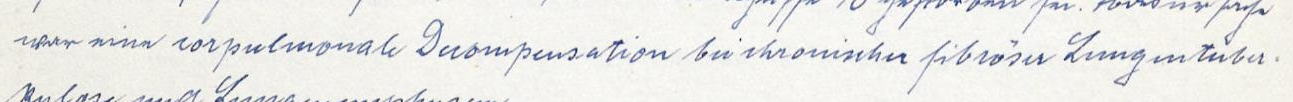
war eine corpulmonale Decompsensation bei chronischer fibröser Lungentuber-
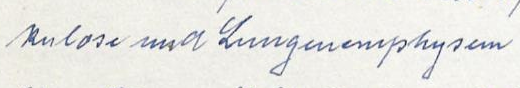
kulose und Lungenemphysem.
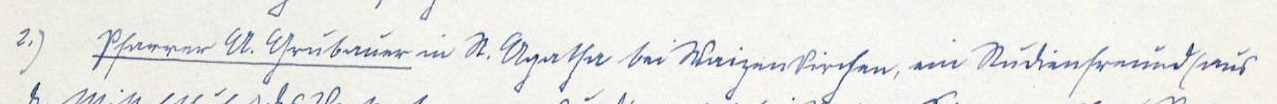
2) Pfarrer A. Grubauer in St. Agatha bei Waizenkirchen, ein Studienfreund (aus
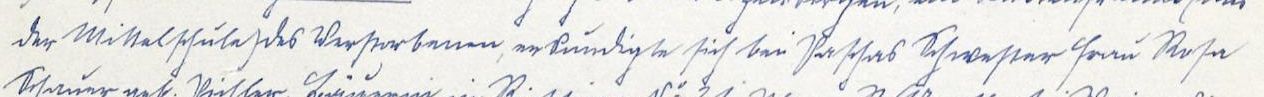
der Mittelschule)des Verstorbenen erkundigte sich bei Paschas Schwester Frau Rosa
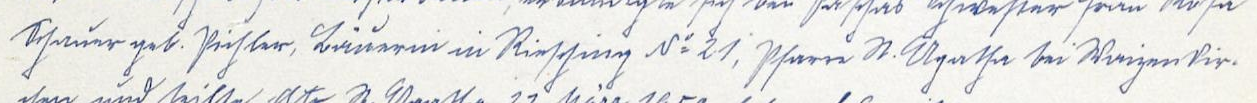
Aschauer geb. Pichler, Bäuerin in Riesching Nr. 21, Pfarre St. Agatha bei Waizenkir-
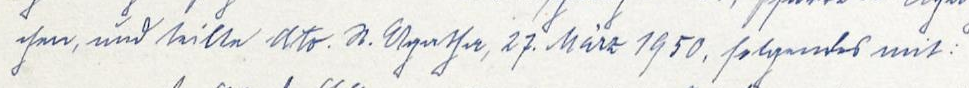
chen, und teilte dto. St. Agatha, 27. März 1950, folgendes mit:
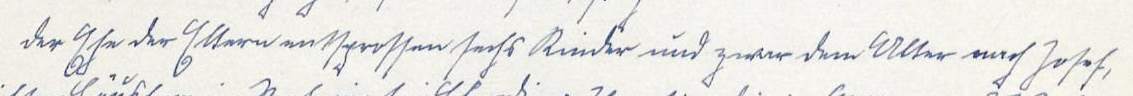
Der Ehe der Eltern entsprossen sechs Kinder und zwar dem Alter nach Josef,
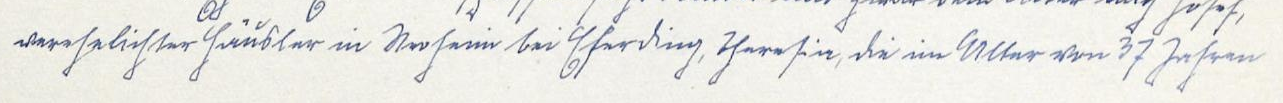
verehelichter Häusler in Stroheim bei Eferding, Theresia, die im Alter von 37 Jahren
